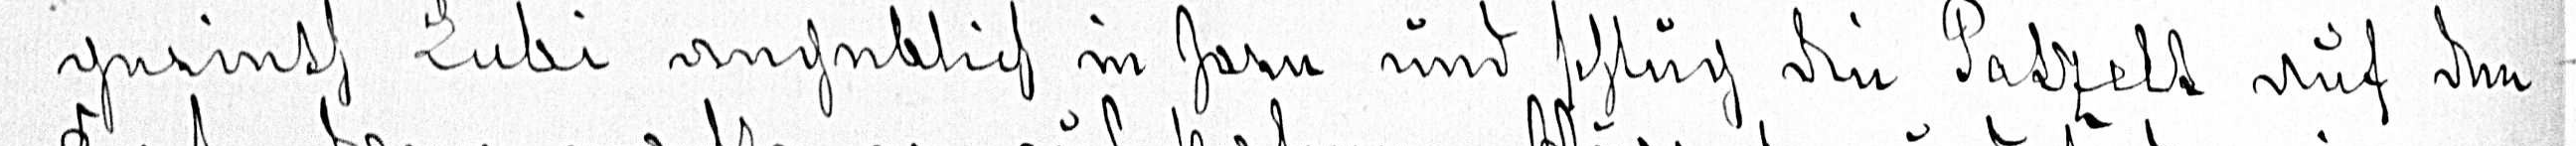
gerieth Lubi angeblich in Zorn und schlug die Patzelt auf den
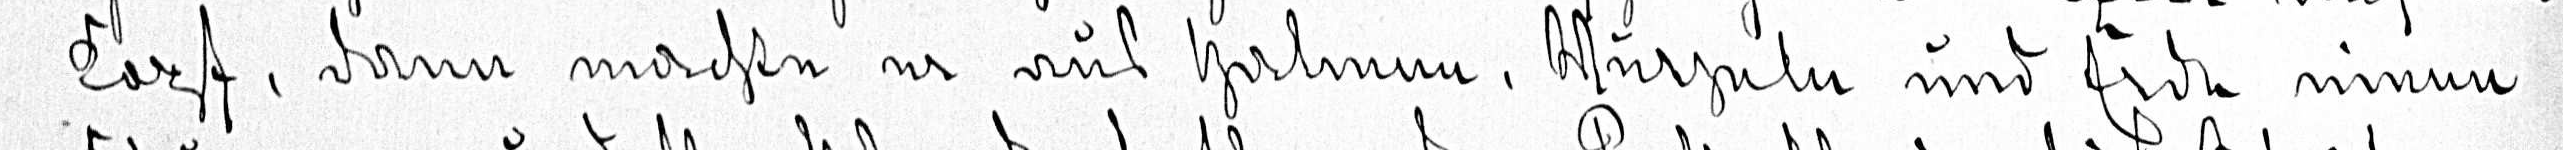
Kopf, dann machte er aus Halmen, Wurzeln und Erde einen
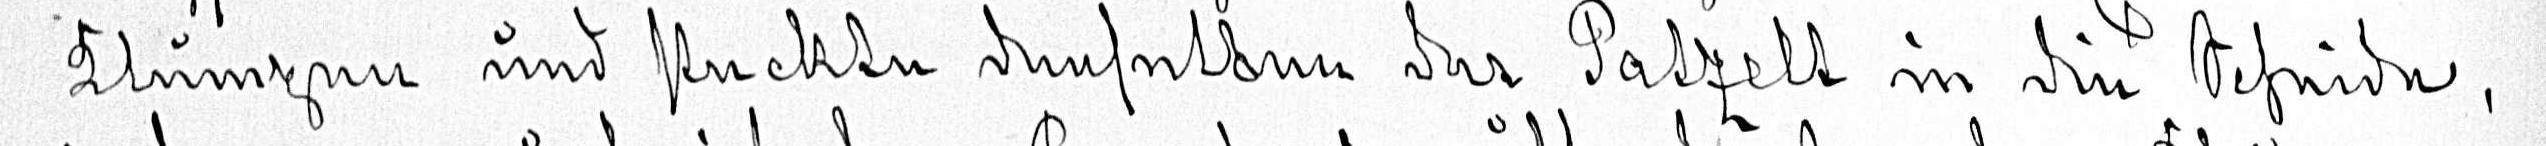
Klumpen und steckte denselben der Patzelt in die Scheide,
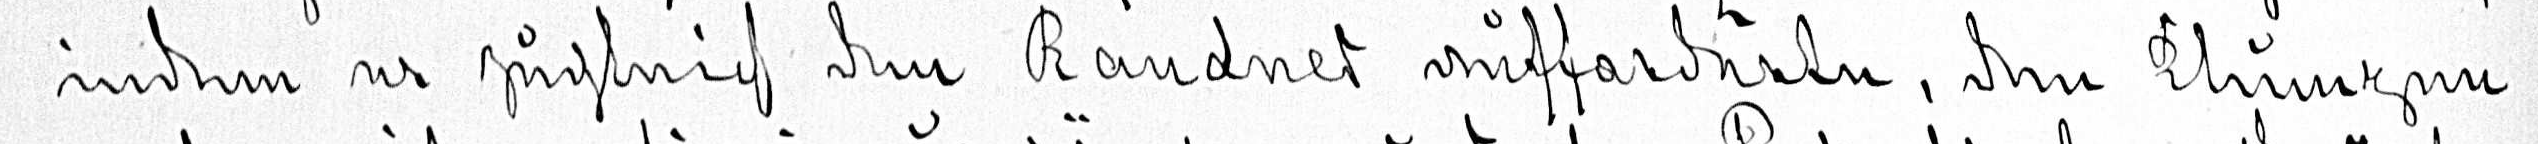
indem er zugleich den Raudner aufforderte, den Klumpen
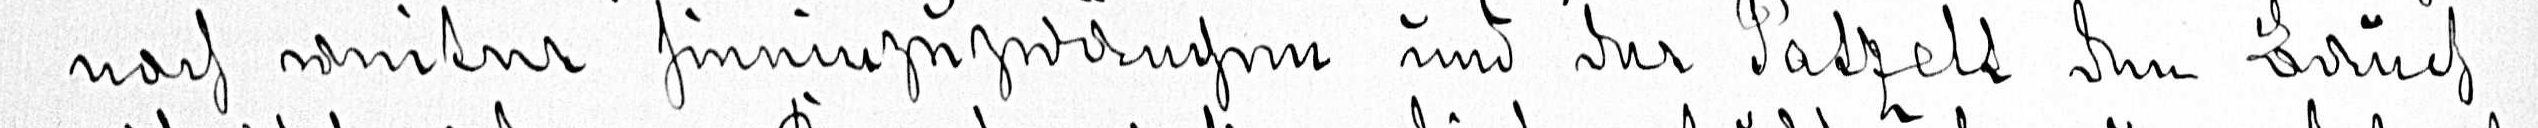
noch weiter hineinzuzwängen und der Patzelt den Bauch
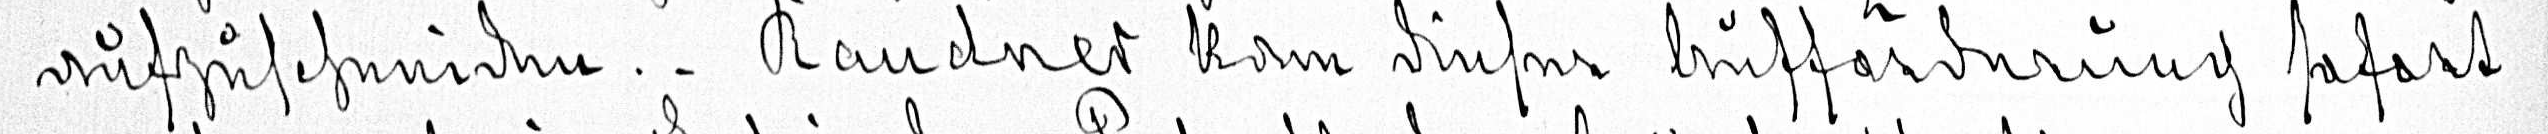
aufzuschneiden. Raudner kam dieser Aufforderung sofort
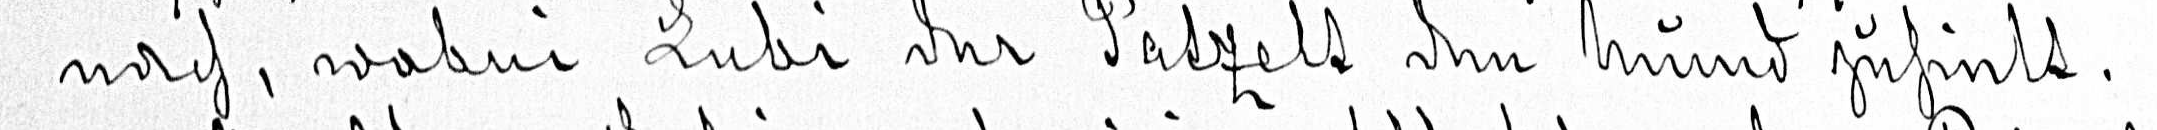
nach, wobei Lubi der Patzelt den Mund zuhielt.
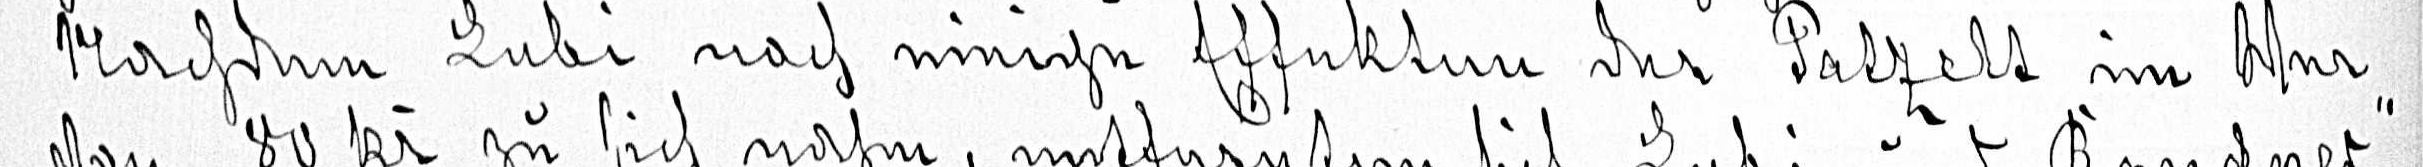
Nachdem Lubi nach einige Effekten der Patzelt in Ver¬
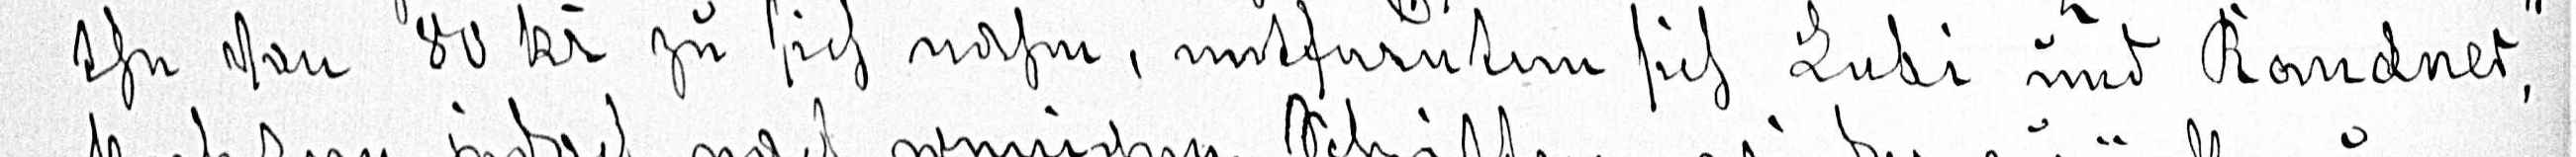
the von 80 kr zu sich nahm, entfernten sich Lubi und Raudner,
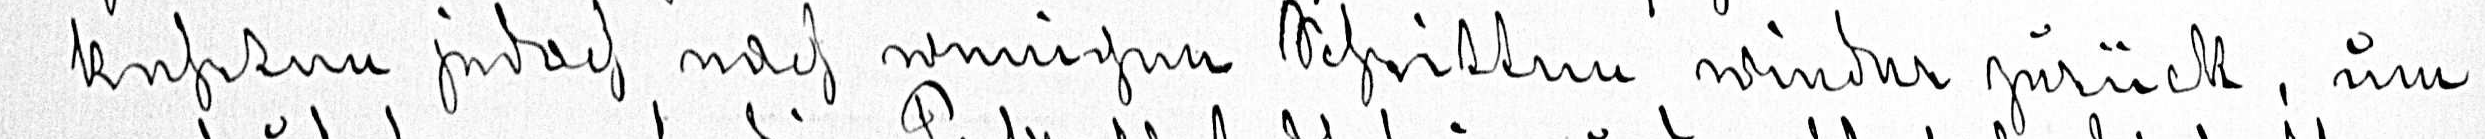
kehrten jedoch nach wenigen Schritten wieder zurück, um
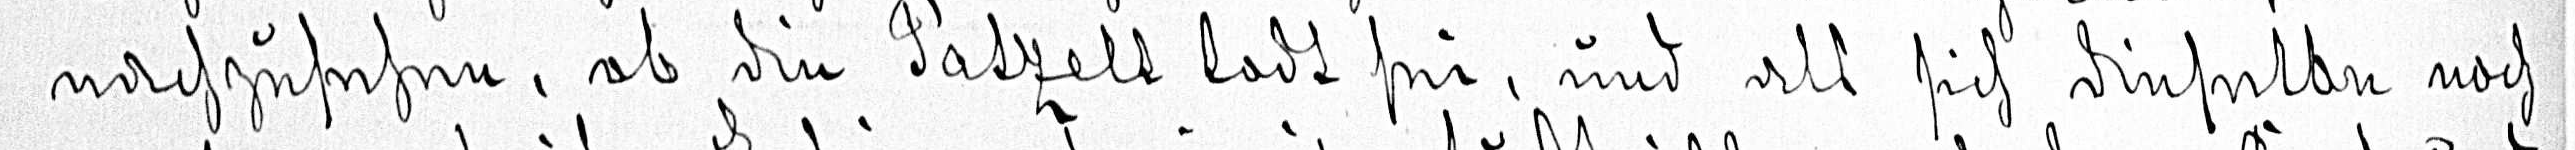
nachzusehen, ob die Patzelt todt sei, und als sich dieselbe noch
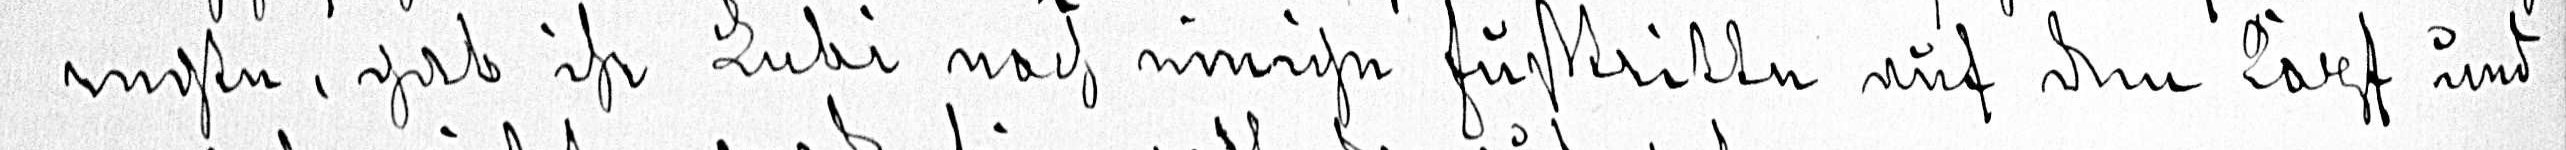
regte, gab ihr Lubi noch einige Fußtritte auf den Kopf und
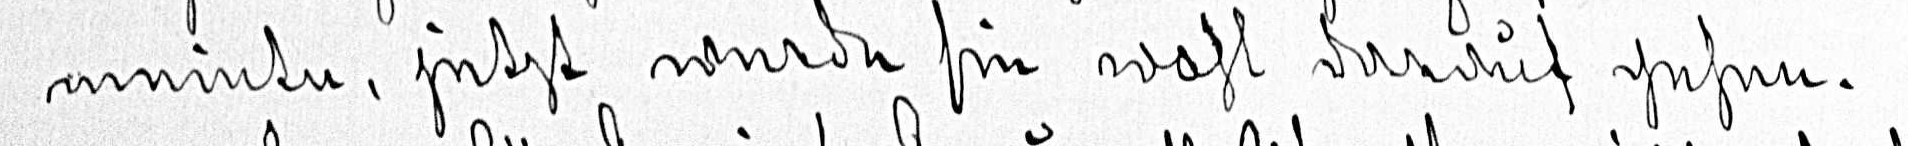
meinte, jetzt wurde sie wohl darauf gehen.
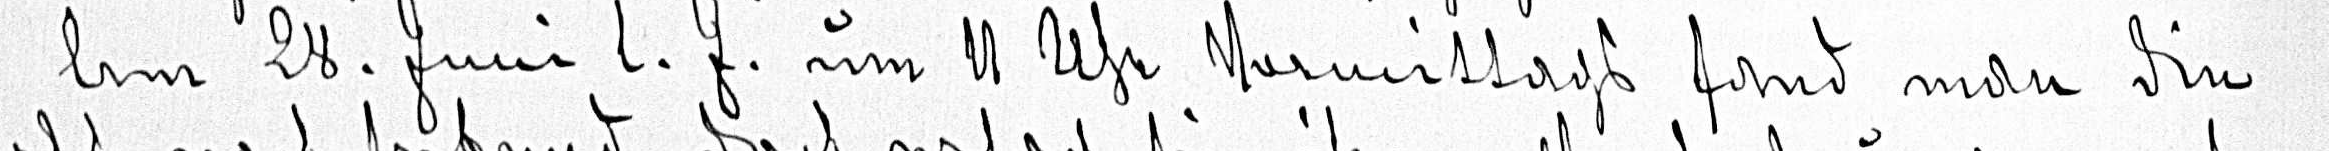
Am 28. Juni l. J. um 11 Uhr Vormittags fand man die
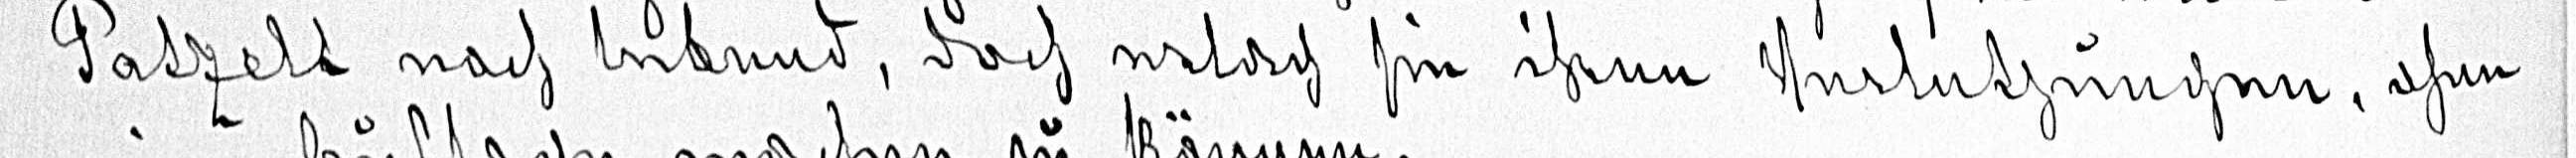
Patzelt noch lebend, doch erlag sie ihren Verletzungen, ohne
